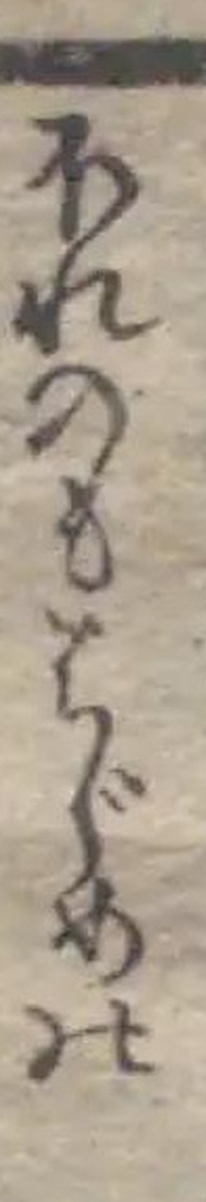ほれのもはじめの
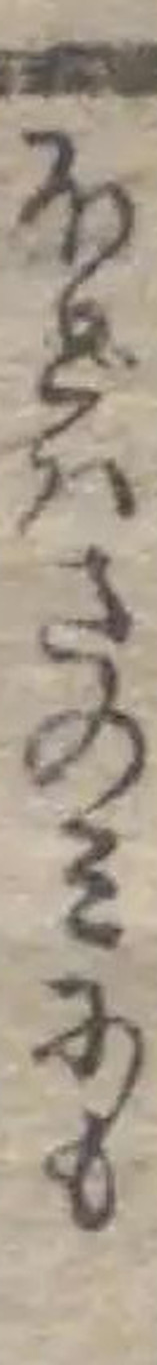ほどはさのみにも
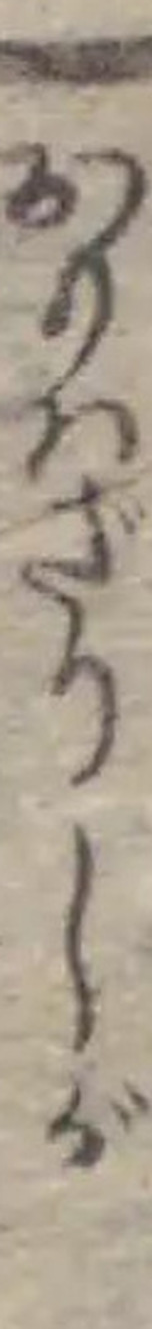おもはざりしが
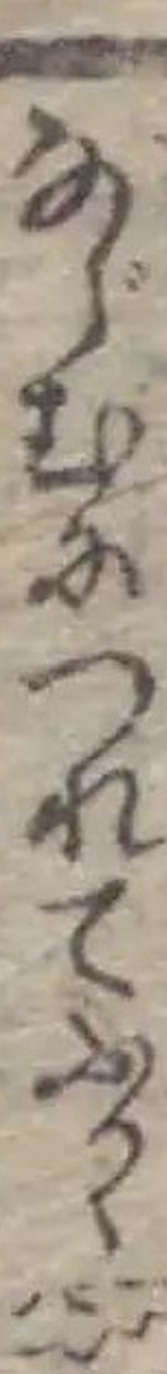なじむにつれてふかく
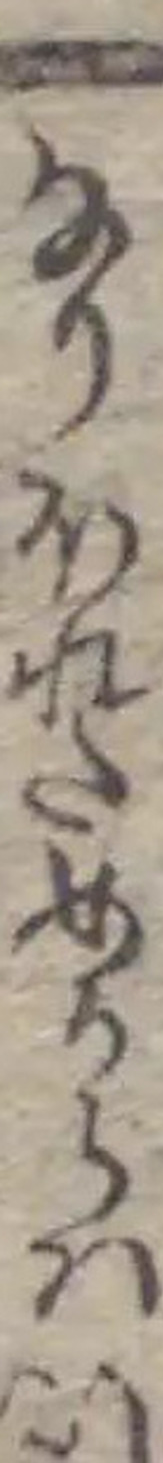なりほれためからは
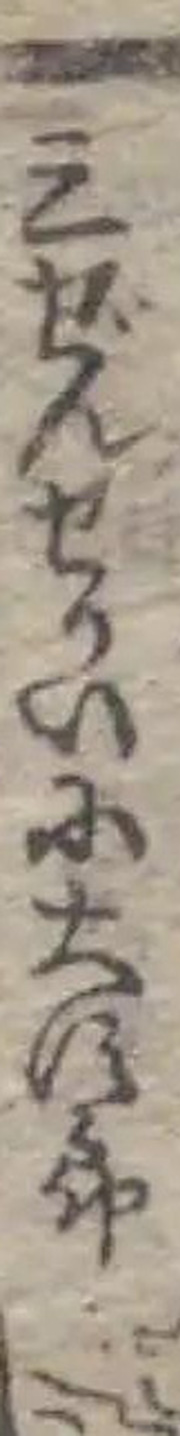三ぜんせかいに大次郎
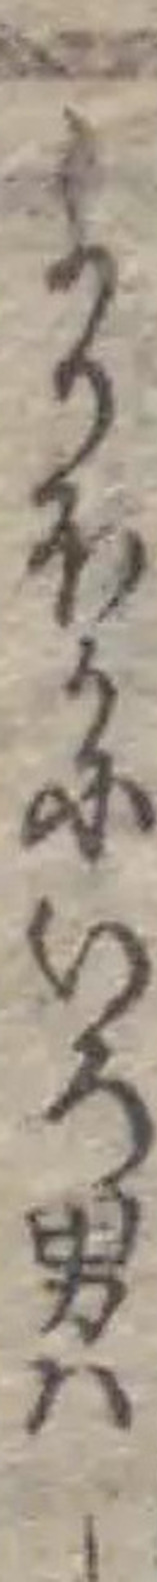よりほかにいろ男は
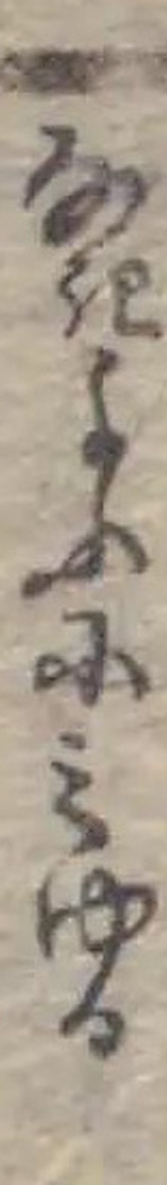なきよふにみゆる
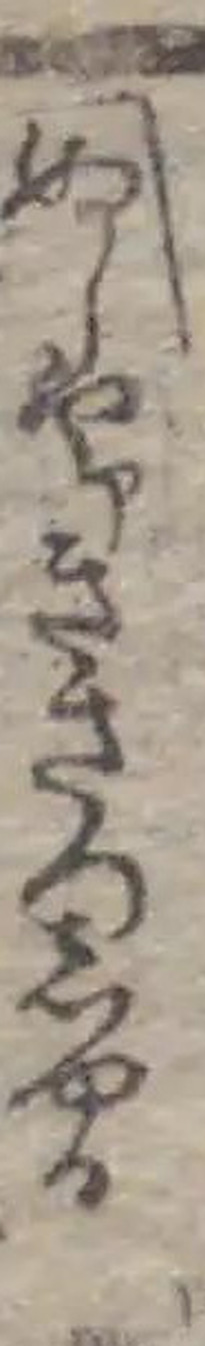〽ぬしやァきさつしやる
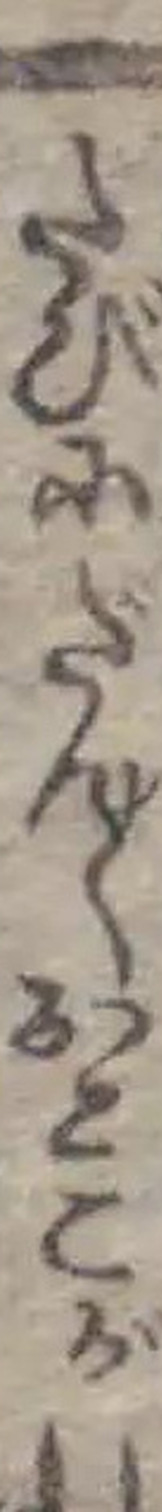たびにだん〳〵おとこが
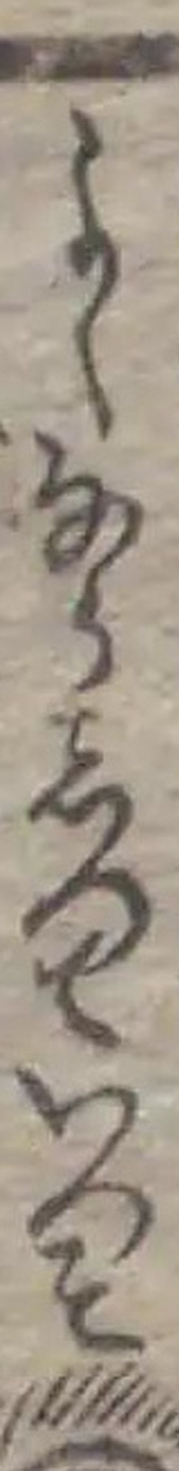よくならしつていつそ
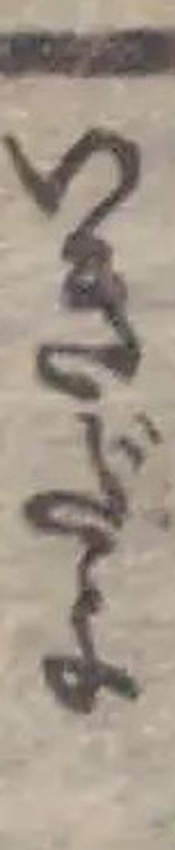いきだよ
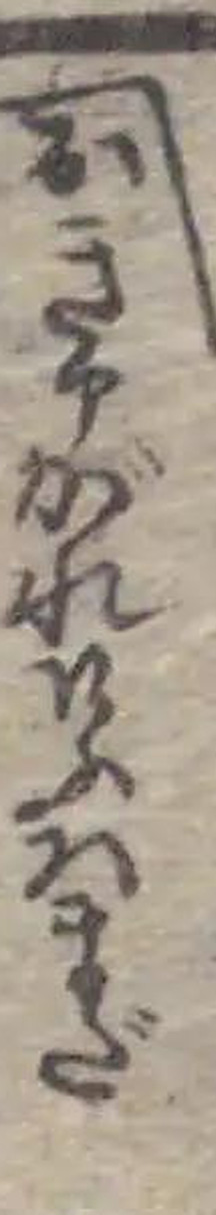〽おきァがれけふはまだ
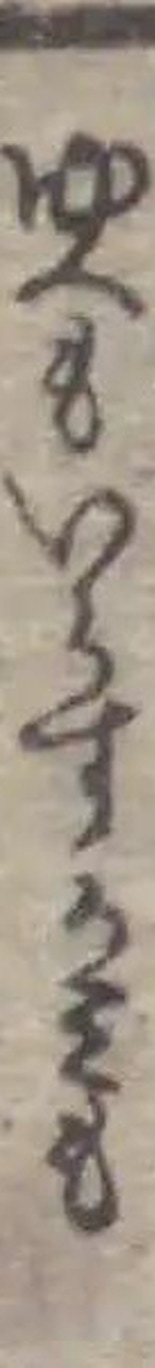ゆへもいらすかみも
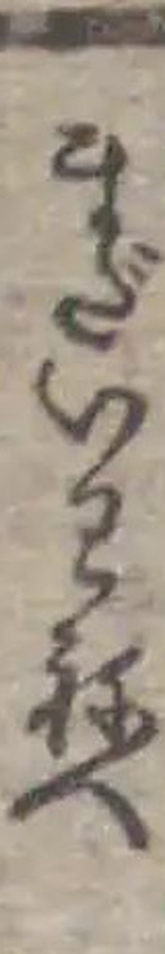まだいわねへ

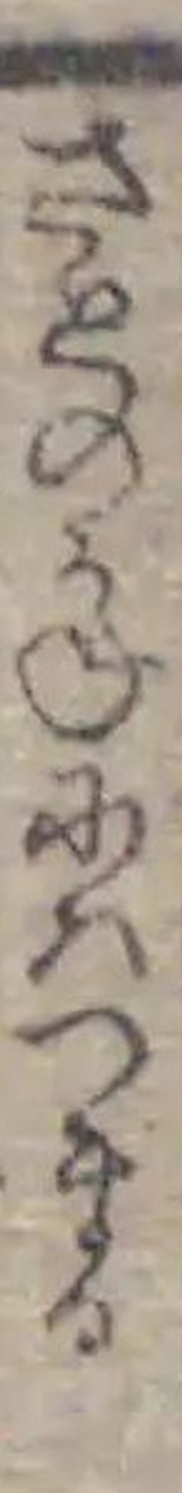さともかねにはつまる
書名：福壽海旡量品玉 3巻
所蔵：国立国会図書館 National Diet Library, JAPAN
